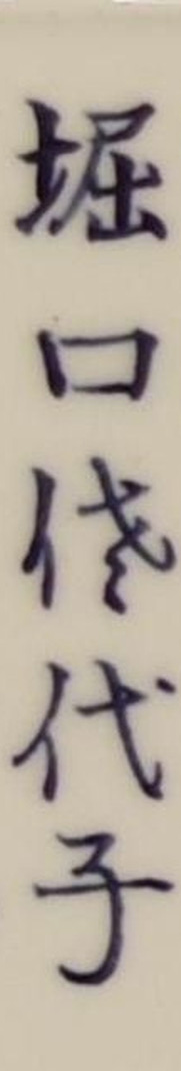堀口佐代子
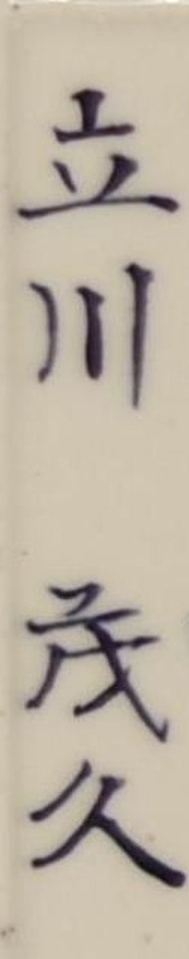立川茂久

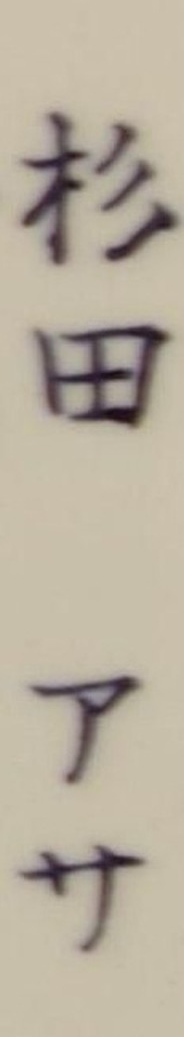杉田アサ
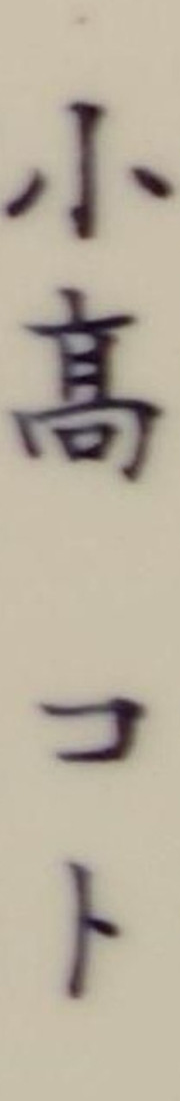小高コト
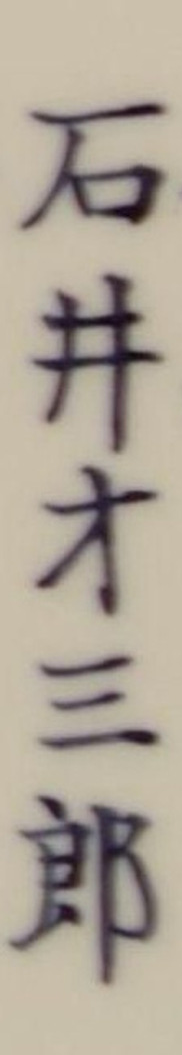石井才三郎
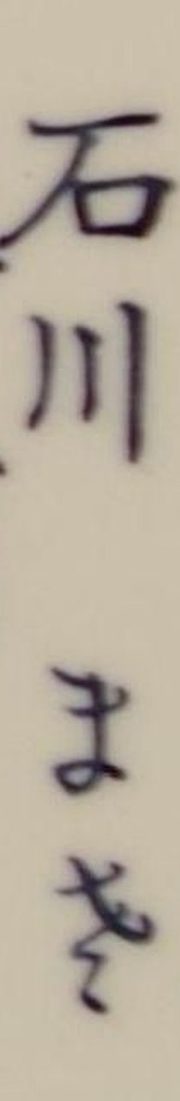石川まさ
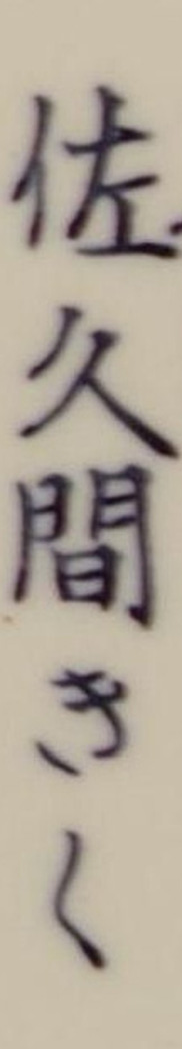佐久間きく
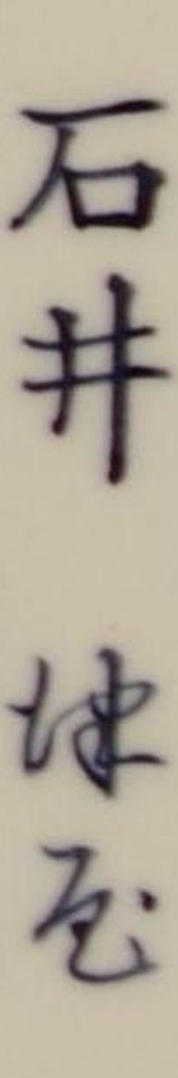石井津屋
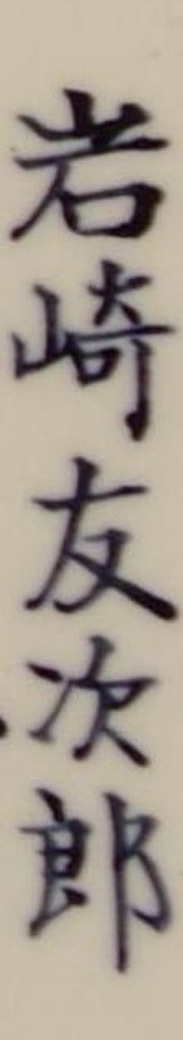岩崎友次郎
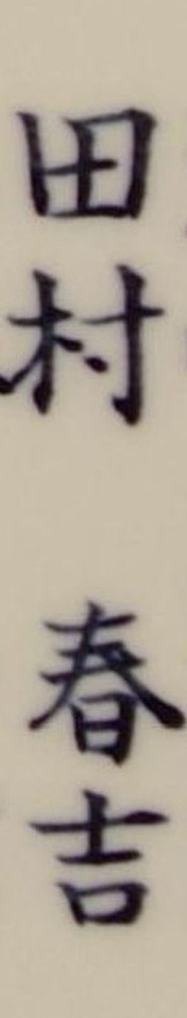田村春吉
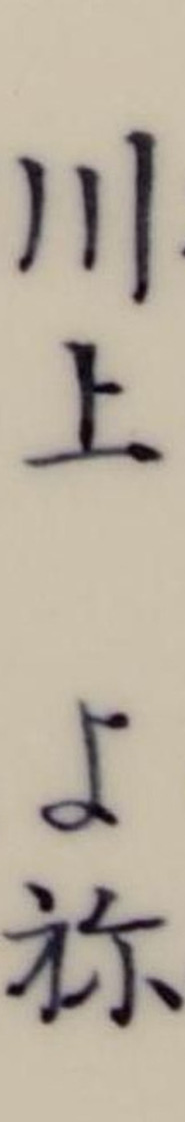川上よね
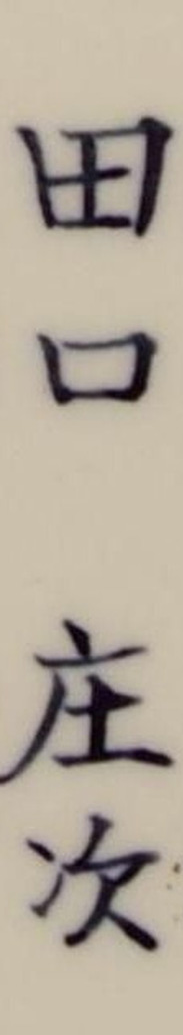田口庄次
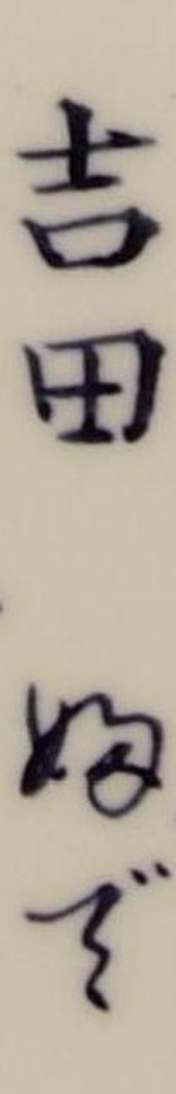吉田ふで
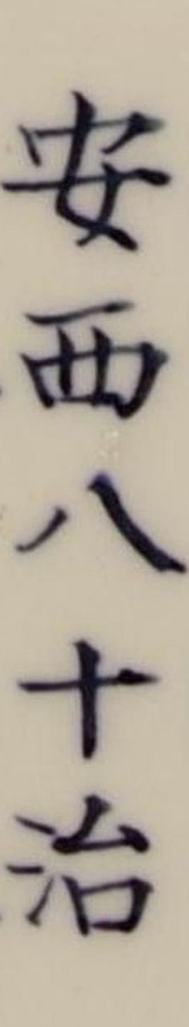安西八十治
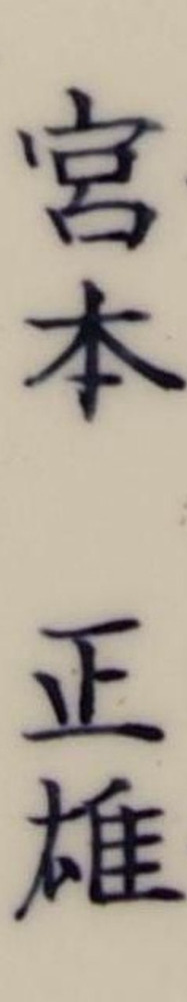宮本正雄
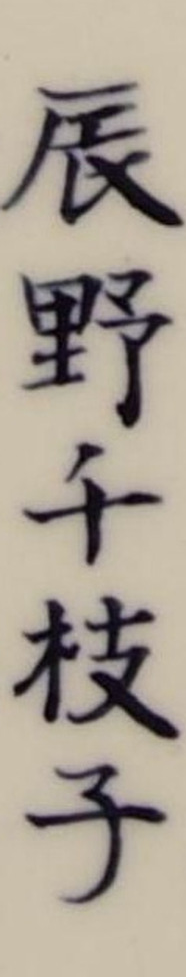辰野千枝子
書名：M~S
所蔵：高野山金剛峯寺
